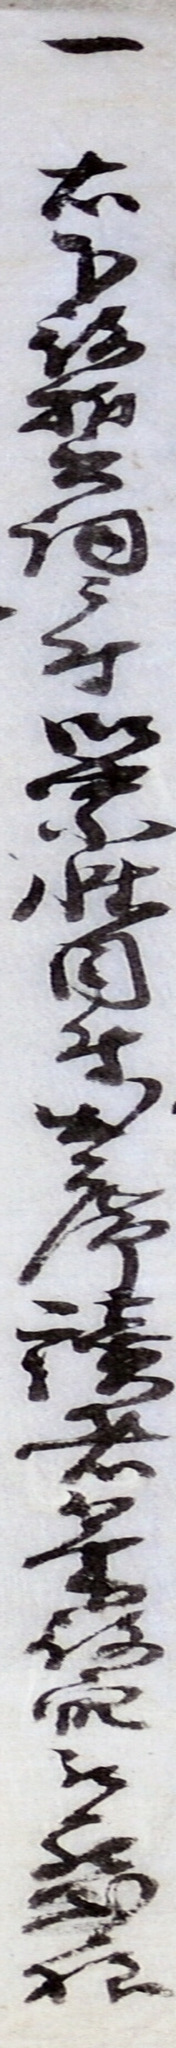一右下役誓詞ニ付御中小性目付出席読者筆役衆被罷出候様
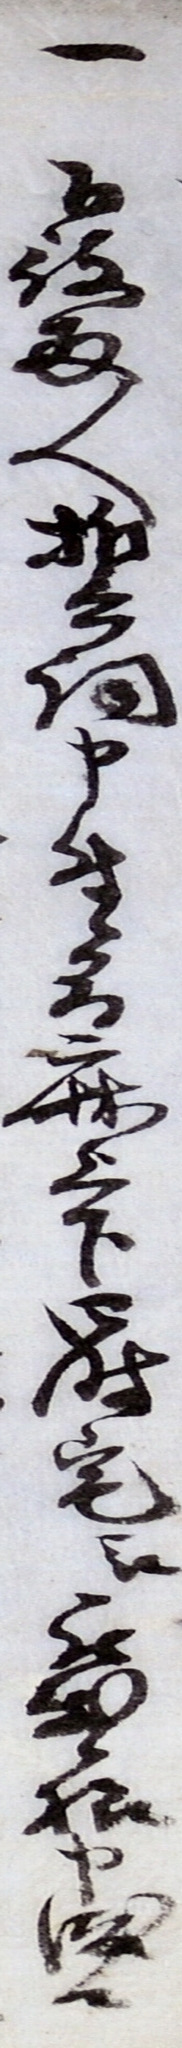一下役両人誓詞申付候間麻上下四時宅江罷出候様申渡候
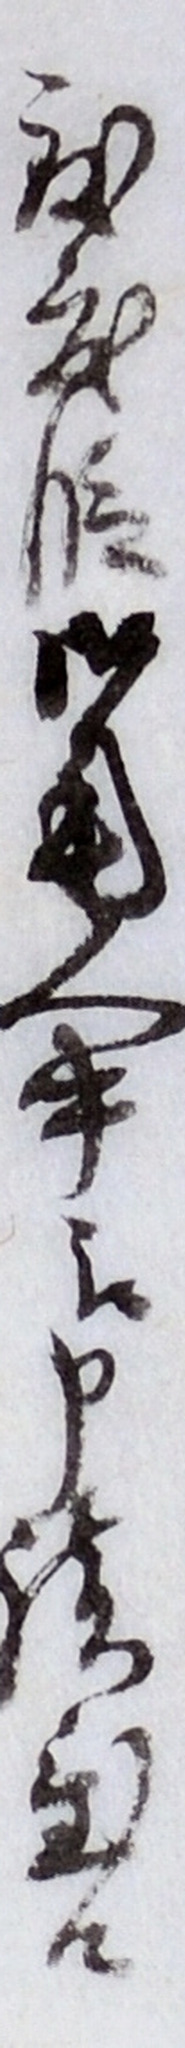致度段御用人中江申談置候
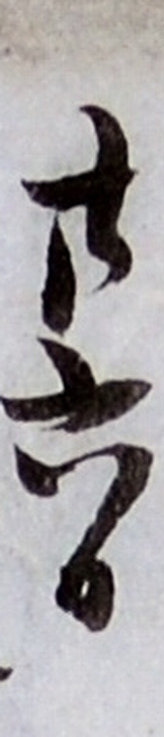廿六日
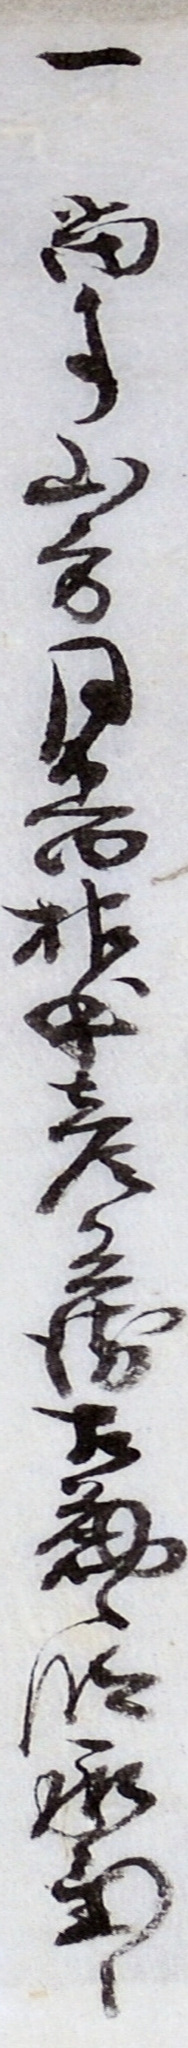一当時山方月番根本彦兵衛相勤候段承置候
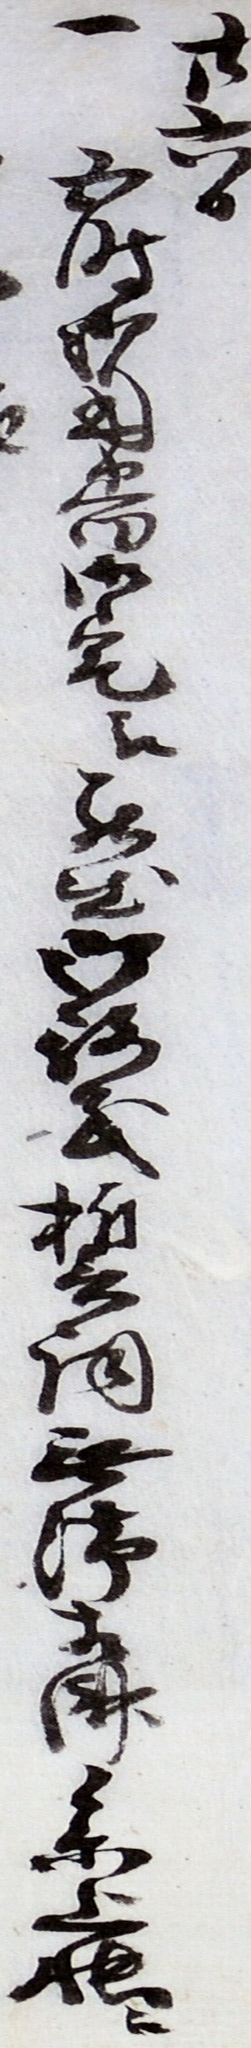一五時御用番御宅江罷出御役義誓詞無滞相済参上帳ニ
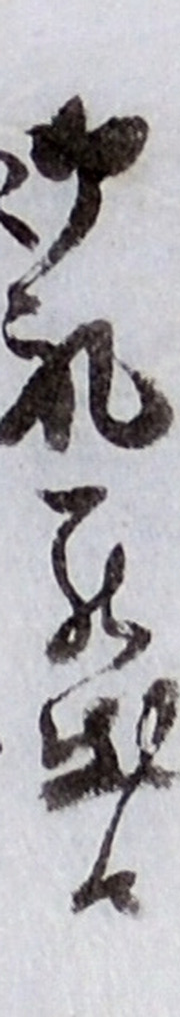御礼罷出候
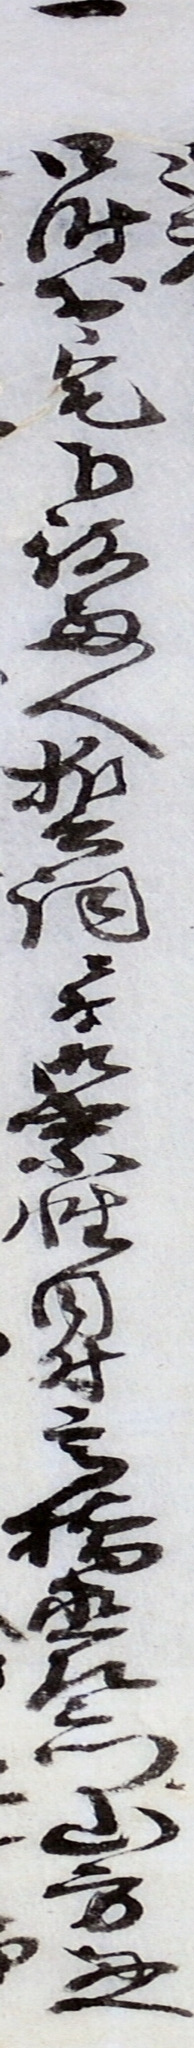一四時於宅下役両人誓詞ニ付御中小性目付高橋丞左衛門山方両人
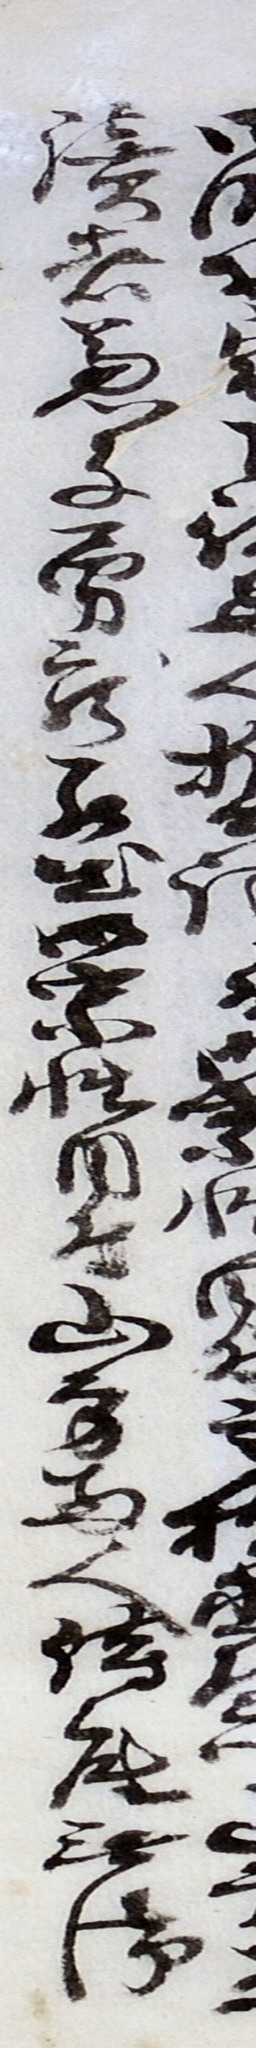一読者兼子勇蔵罷出御中小性目付山方両人侍座無滞
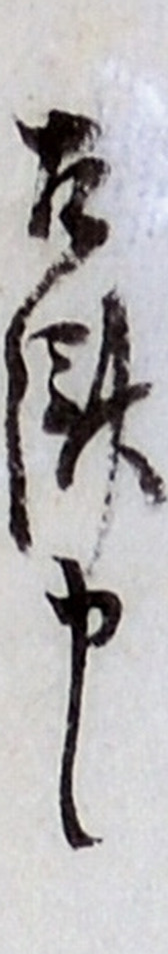相済申候
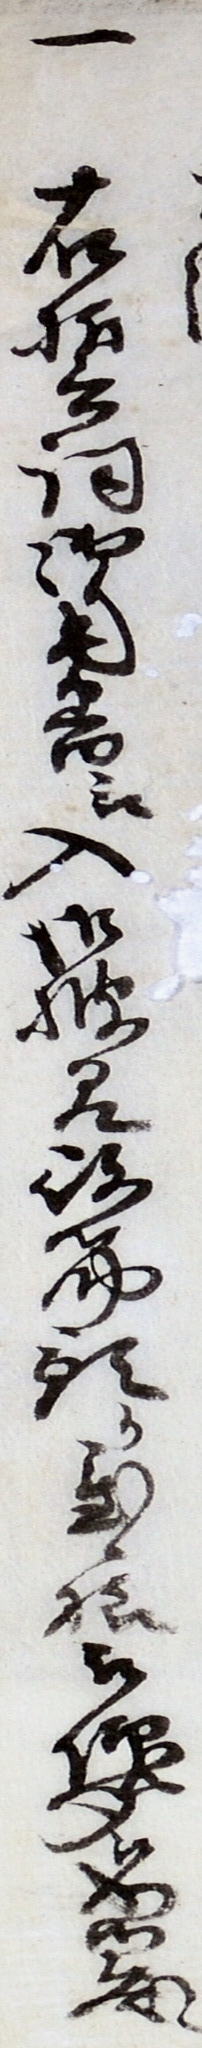一右誓詞御用番江入御披見役筋預り置候様被仰聞被成候処
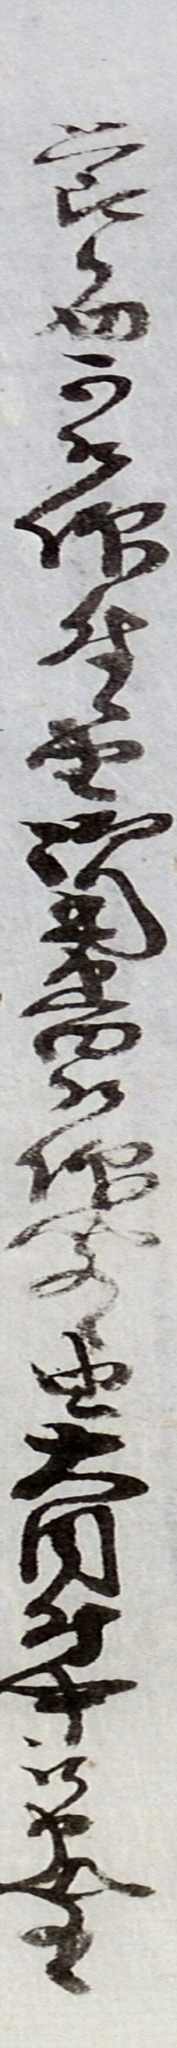節者可被仰付候由御用番被仰聞候由大目付中被申聞候
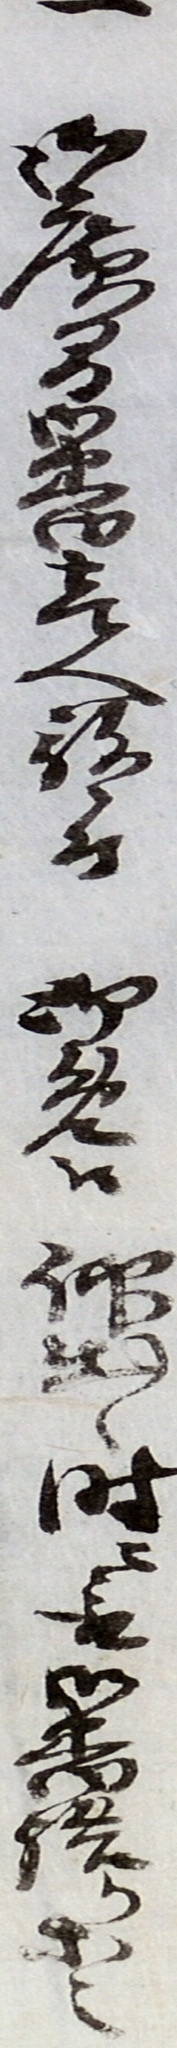一御広間御番壱人役ニ付御免被仰付候時ニは御番詰り等之
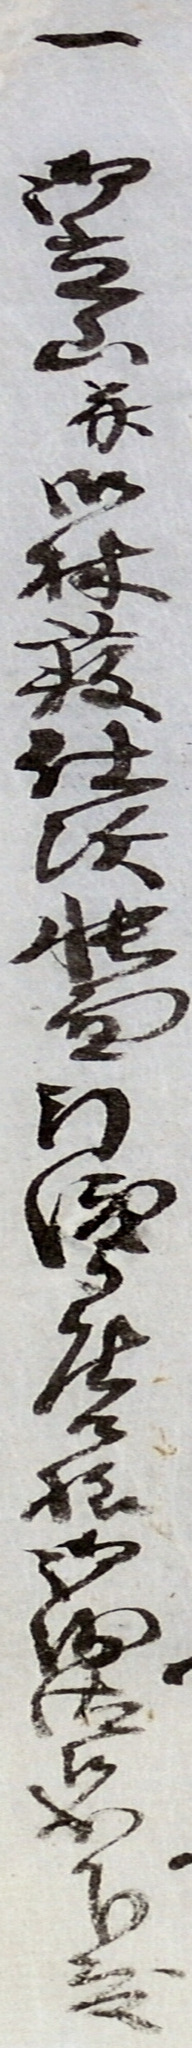一御立山并御林薮仕訳帳面引渡御座候様御沙汰被成下度
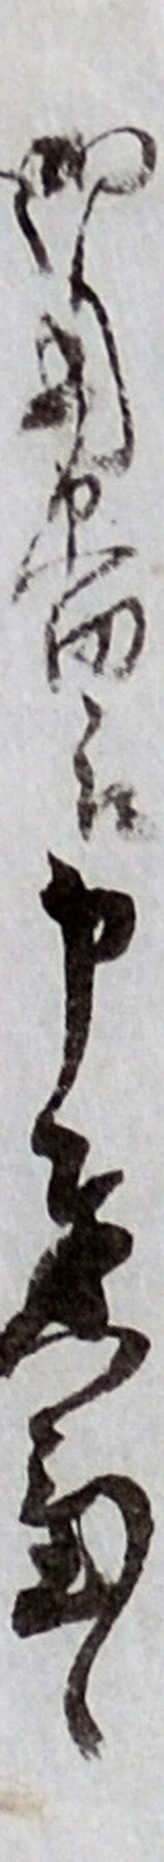御用番江申達置候
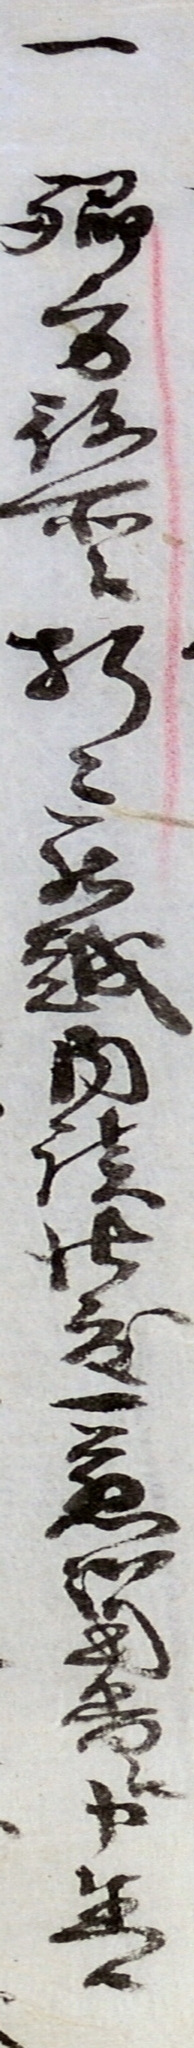一郷方役所江折々罷越内談仕度一應御用番江申達候
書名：御山奉行御用留
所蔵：伊那市立高遠町図書館・合同会社AMANE
